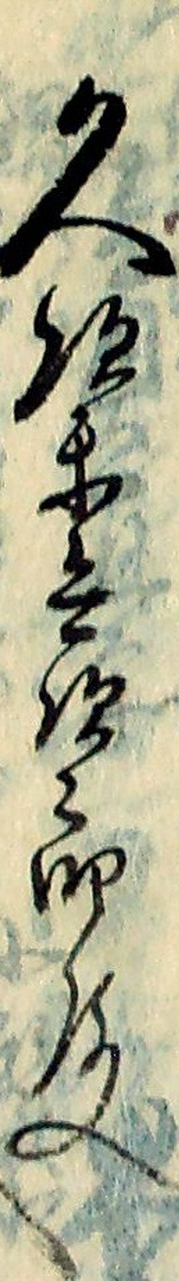久須米兵次郎殿
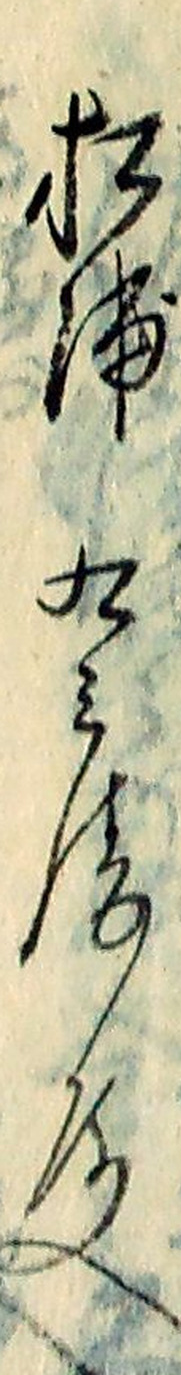松浦九兵衛殿
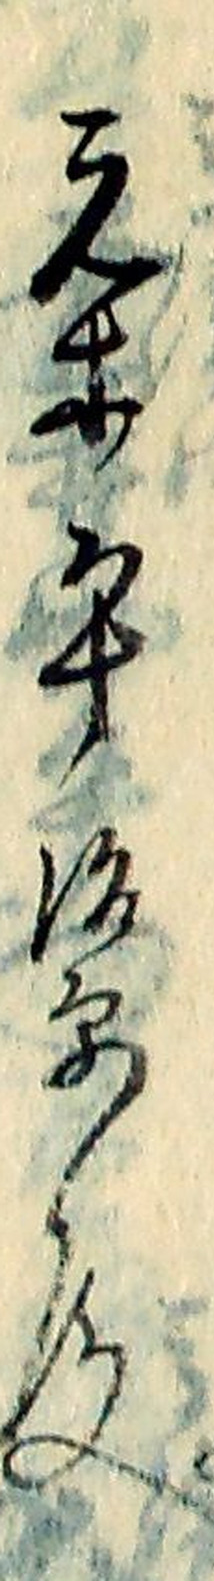元木平治兵衛殿
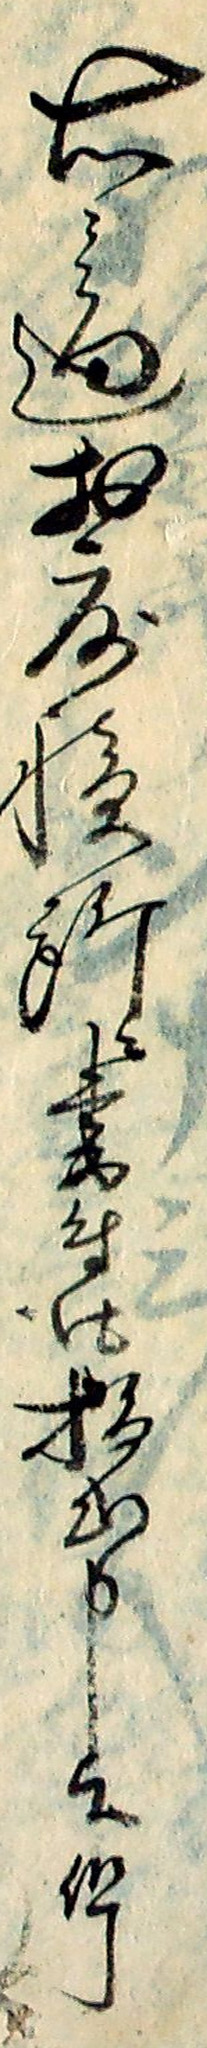右之通於荷積所に書付仕指出申候但し
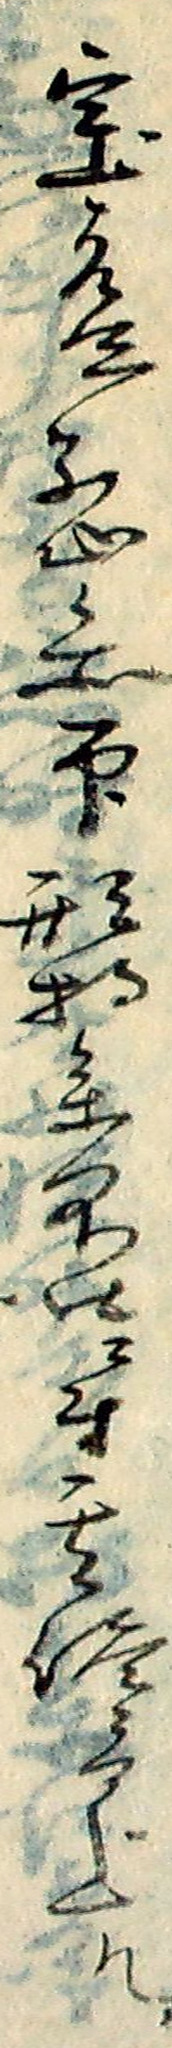宝吉殿罷出候所印形持参不仕に付其儘に可申上候

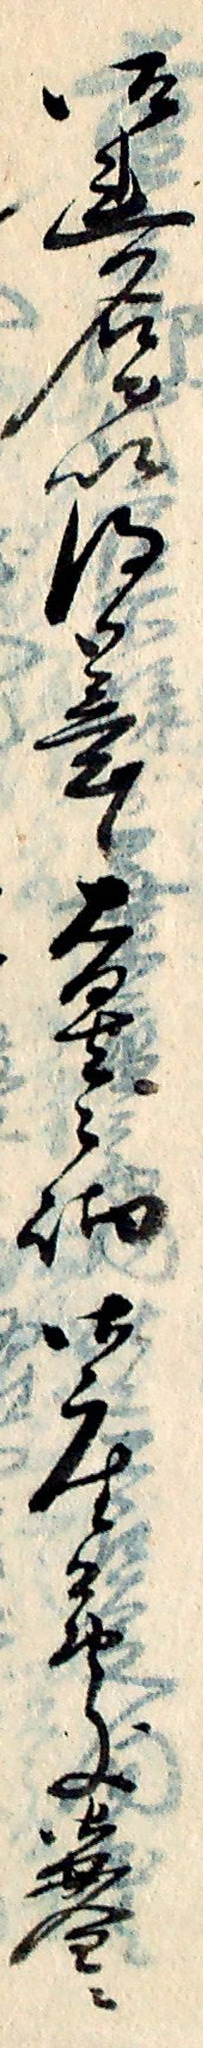御連名を以得御意候大暑之砌御座候処御安全に
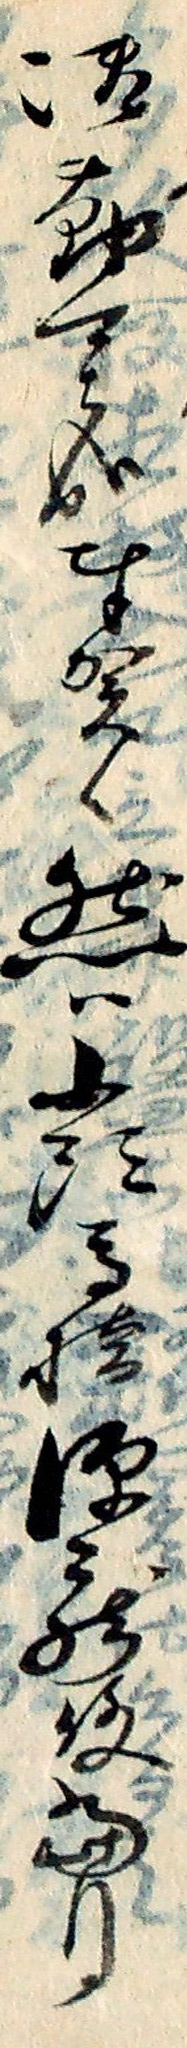御勤可被成奉賀候然は小頭馬橋源蔵儀当月
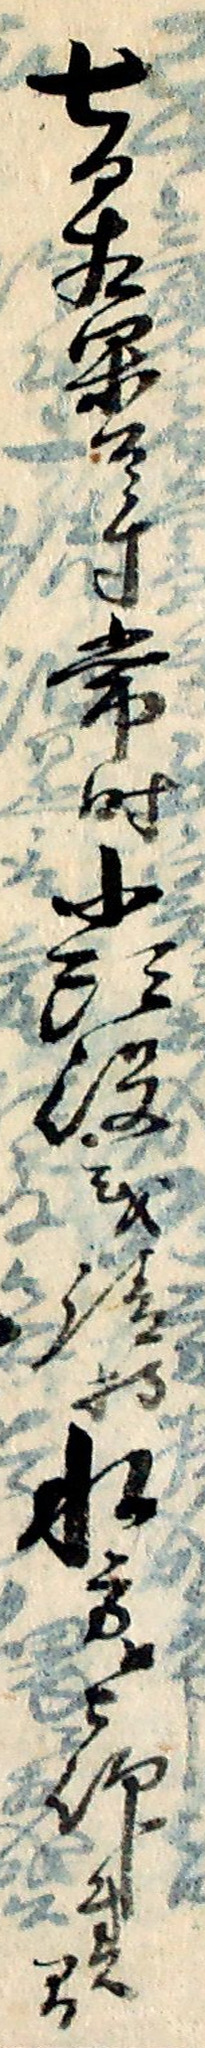七日相果候に付常時小頭役義請持私方え被仰付候間
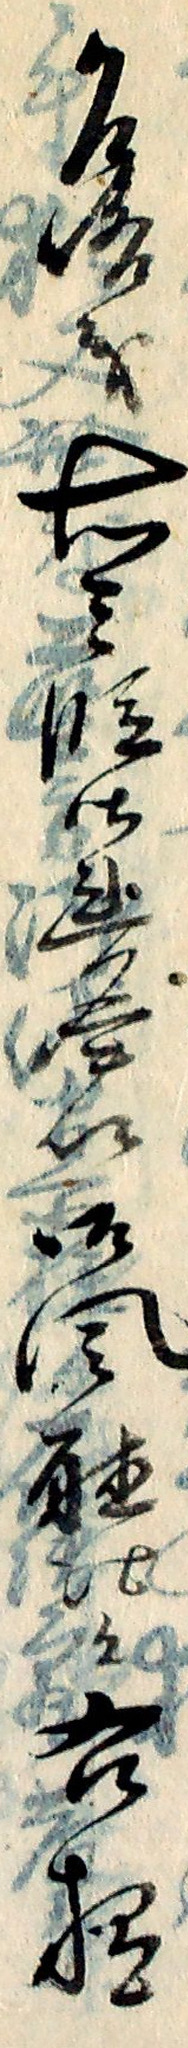乍略義右之段御連名を以御風聴仕候右様に
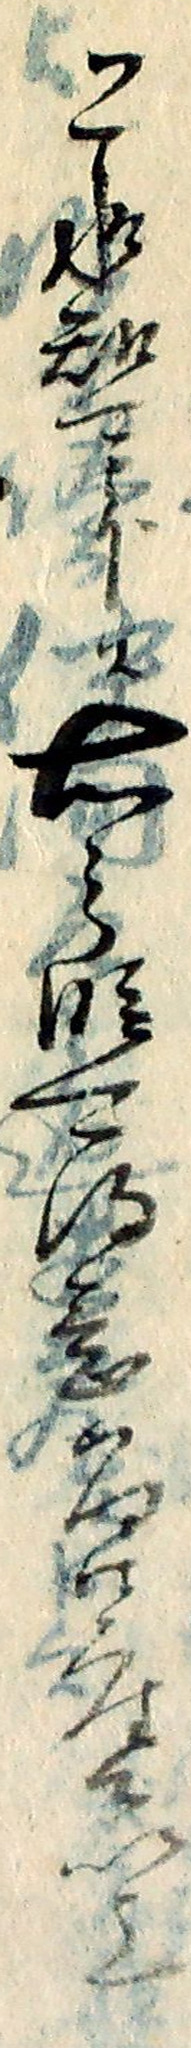御承知可被下候右之段可得御意如此御座候以上
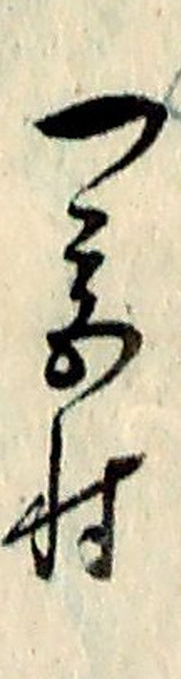一宮村
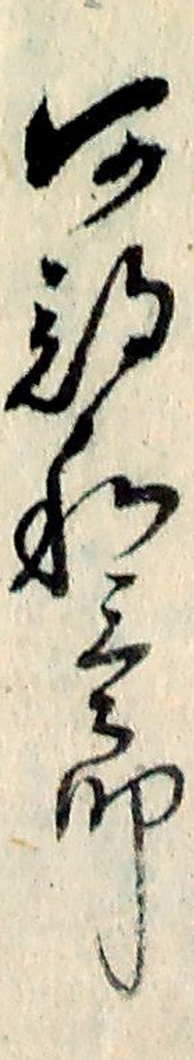阿部和三郎
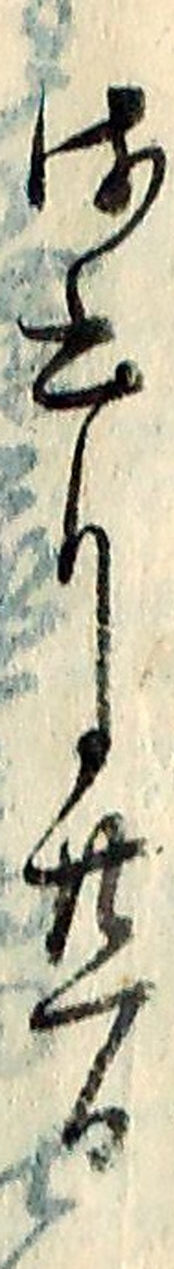戌六月廿一日
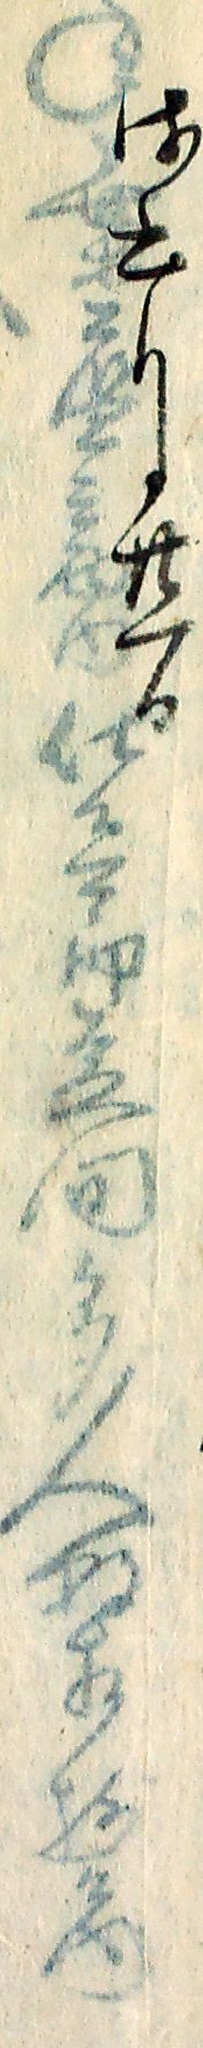戌六月廿一日
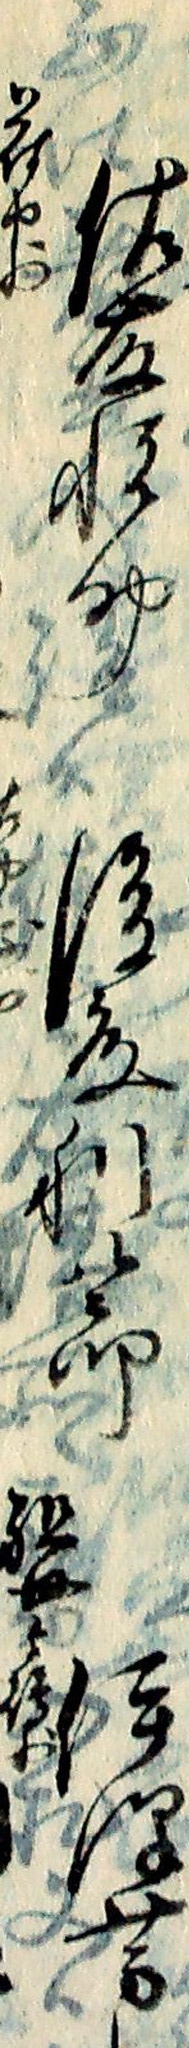佐藤悦助後藤利八郎伊沢芳助
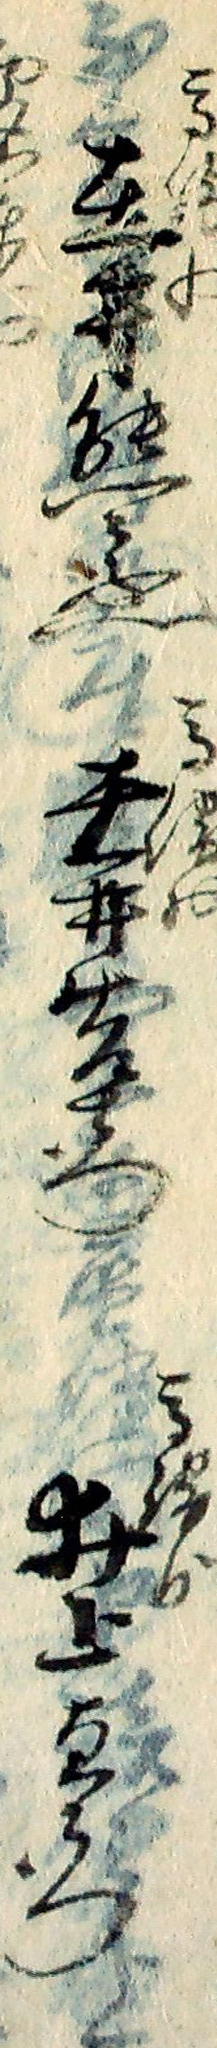在井熊之丞在井吉右衛門井上貞右衛門
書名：諸御願書控(後藤氏壱番）
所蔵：鳴門教育大学 Naruto University of Education
